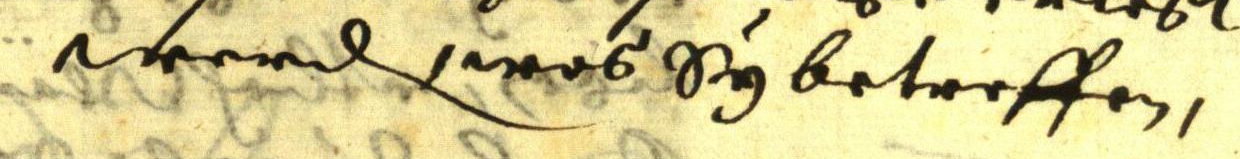werd, was Sȳ betreffen,
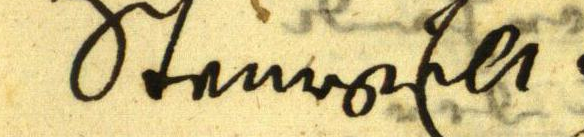Steūrgelt
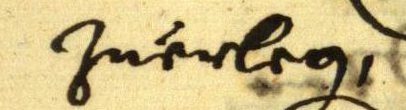Zūerleg,
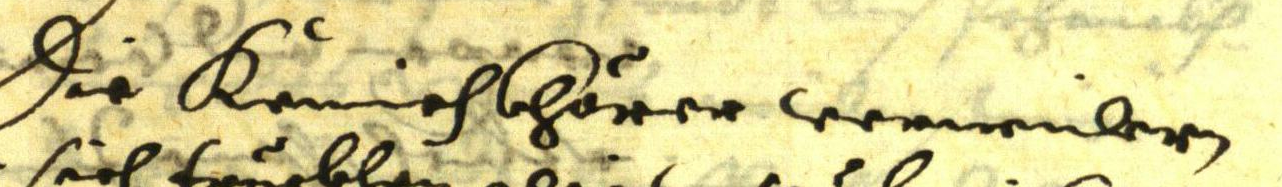Die Kemichkhōrer verwidern
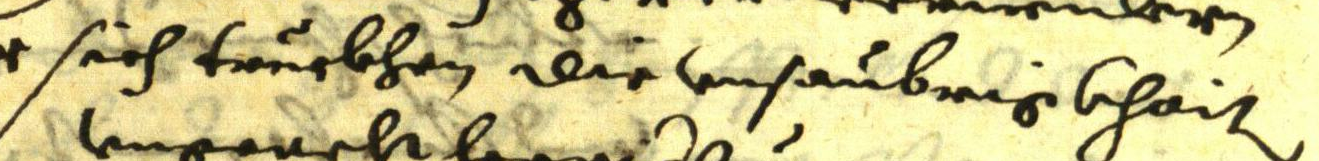sich trūckhen die vnsaūbrigkhait
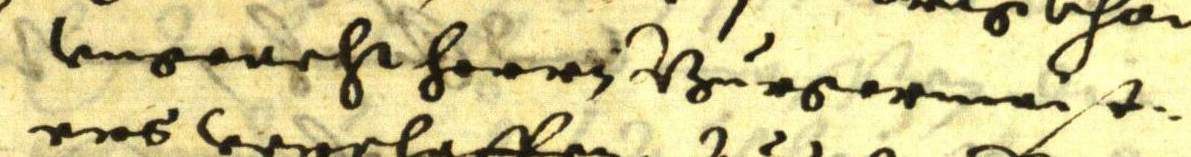vngeacht herrn Būrgermaist¬
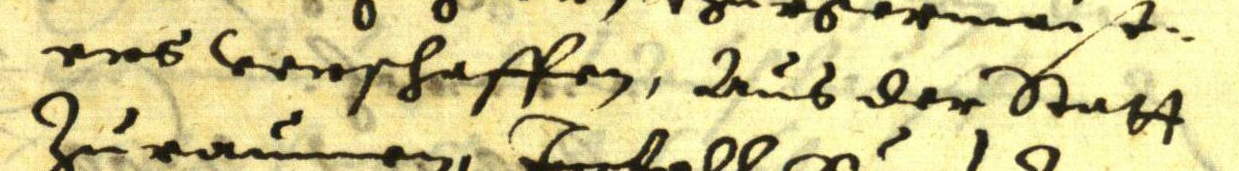ers verschaffen, Aūs der Statt
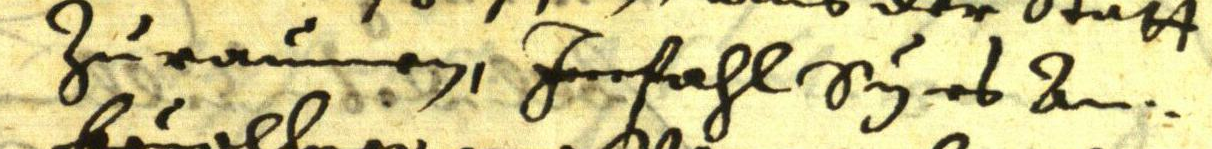Zū raūmen, Infahl Sȳ es An¬
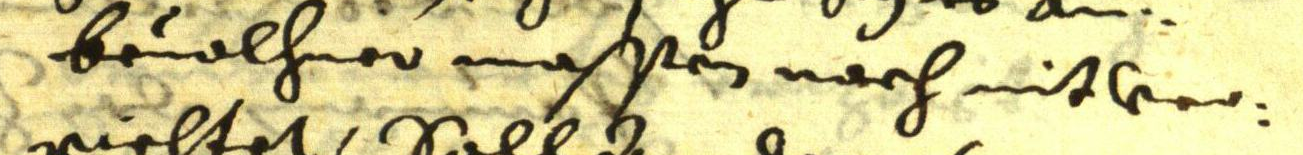beūolhen massen noch nit ver¬
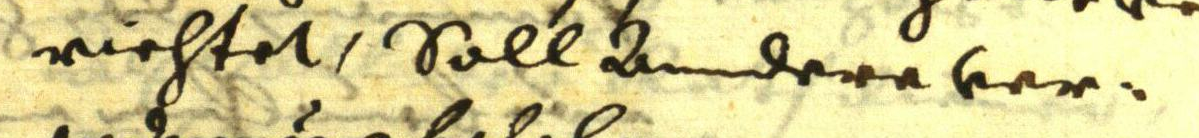richtet, Soll Anndere ver¬
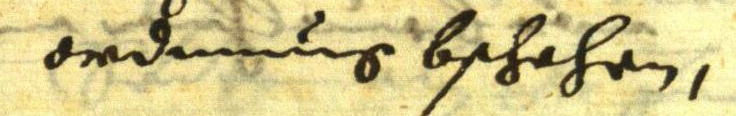ordnūng bschehen,
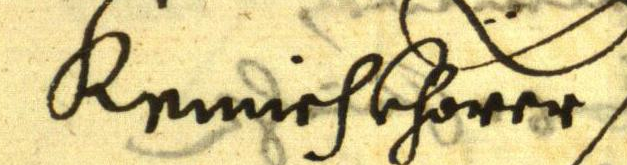Kemichkhörer
